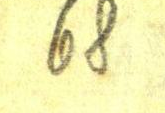68
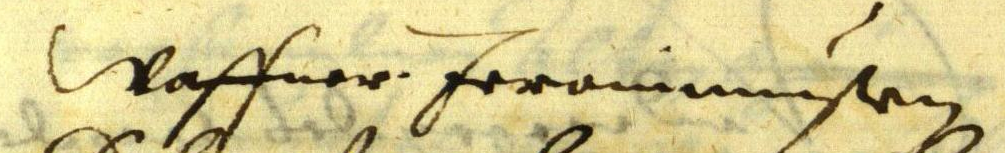Waffner. Jeronimūesen
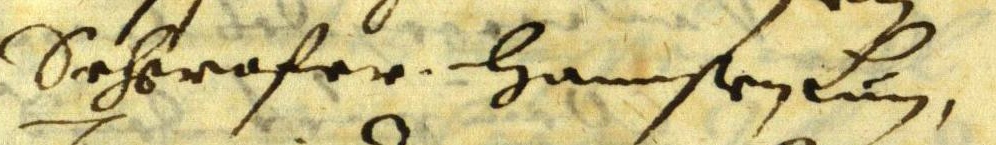Schgrafer. Hannsen Lūn,
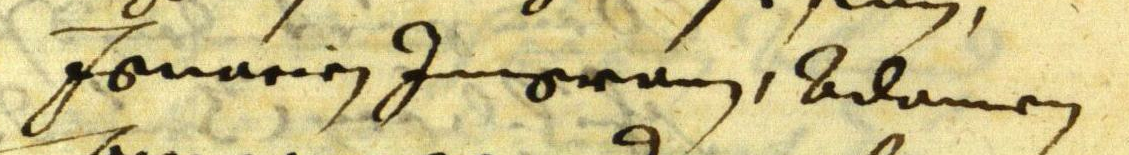Ignacien Inngram, Adamen
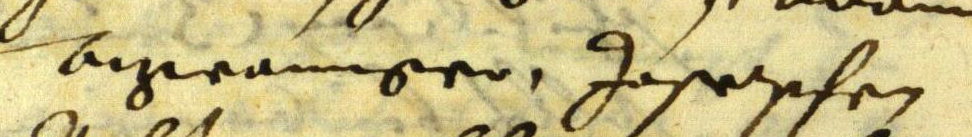Azwannger, Joseffen
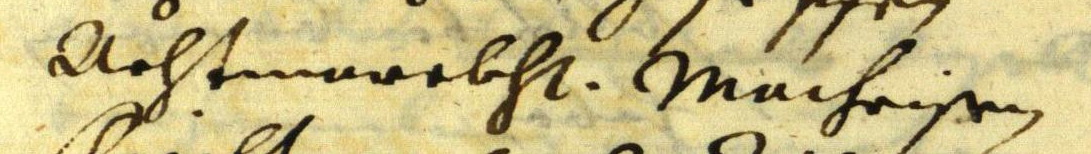Achtmarckht. Matheisen
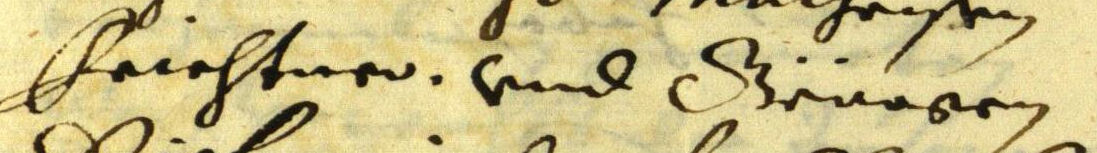Feichtner. vnd Geörgen
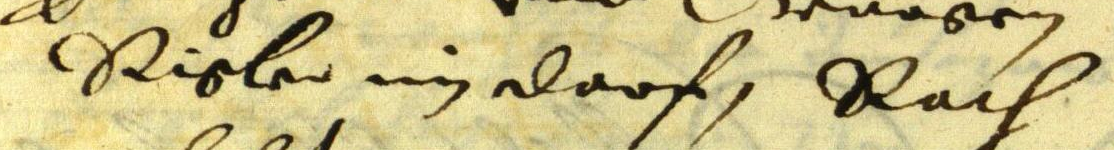Rigler im dorf, Rath
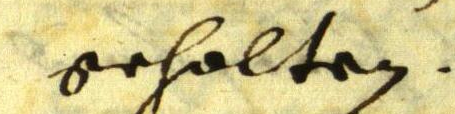gehalten.
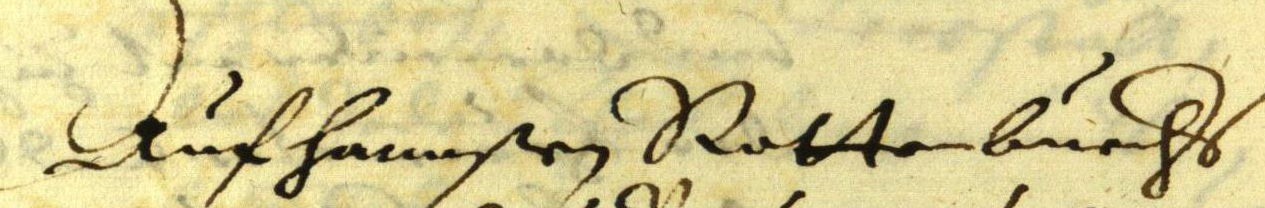Aūf hannsen Rottenbūechs
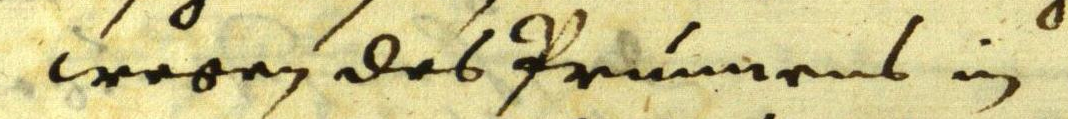wegen des Prūnnens in
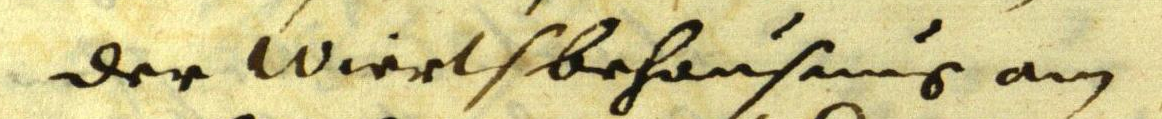der Wiertsbehaūsūng am
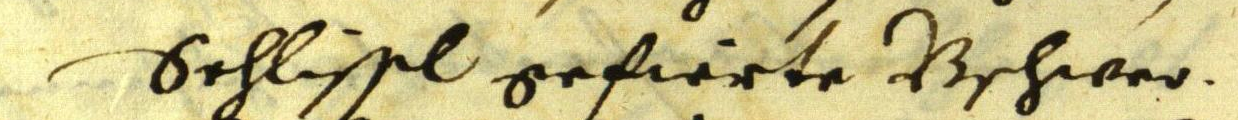Schlissl gefierte Bschwer.
